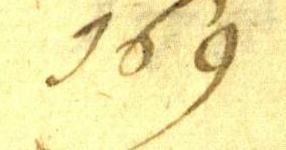169
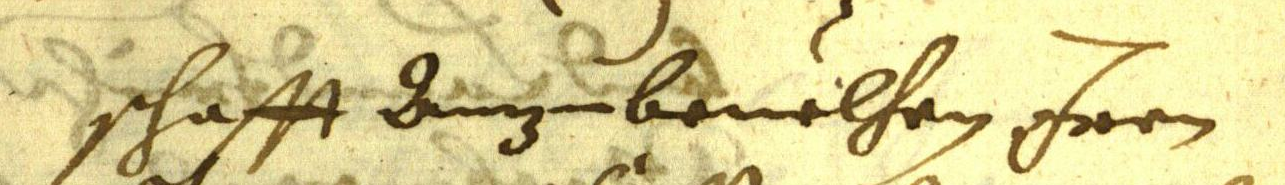schafft Anzūbeūelhen Iren
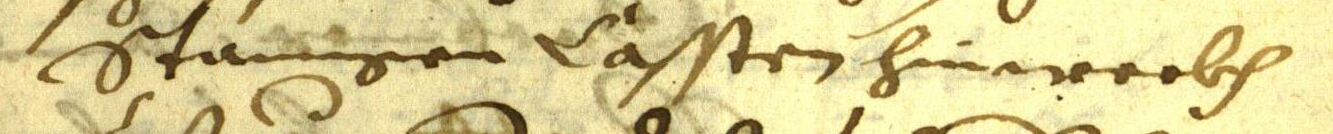Stanngen Cassten hinweckh
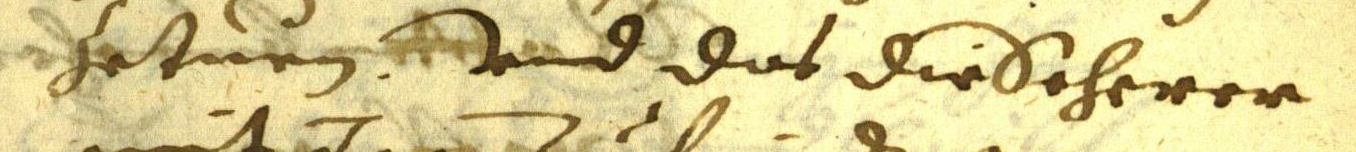Zetūen. vnd das die Scherer
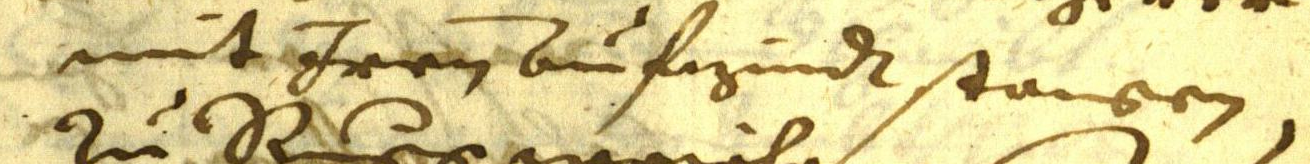mit Iren Aūfzindt stangen
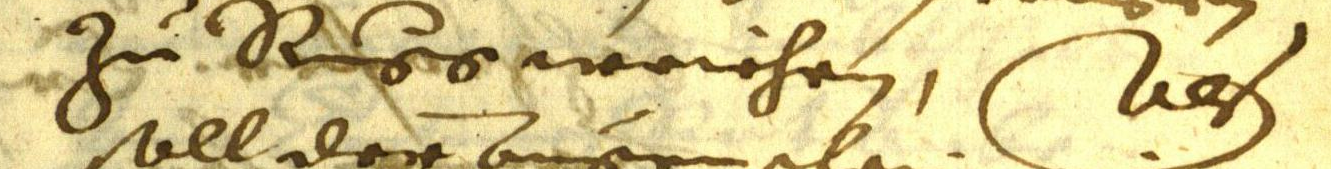Zū Rūgg weichen, Als
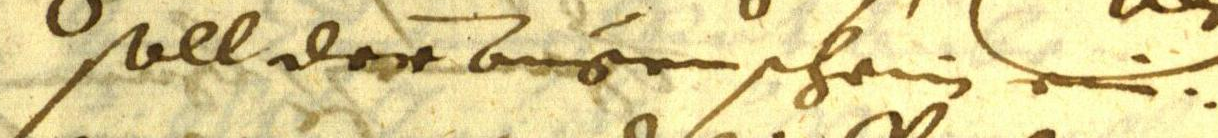soll der Aūgenschein ein¬
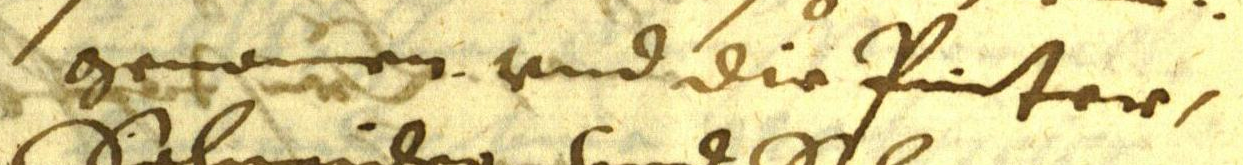genomen. vnd die Pinter,
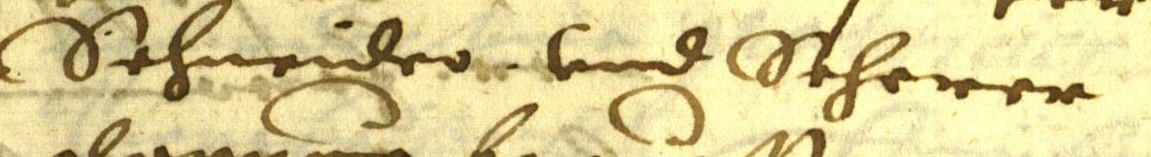Schneider. vnd Scherer
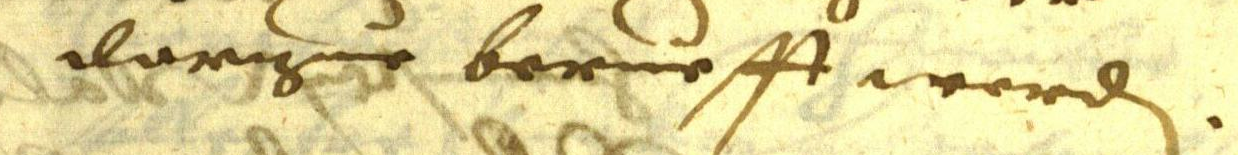darzūe berūefft werd.
